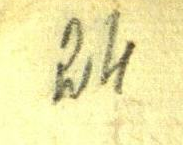24
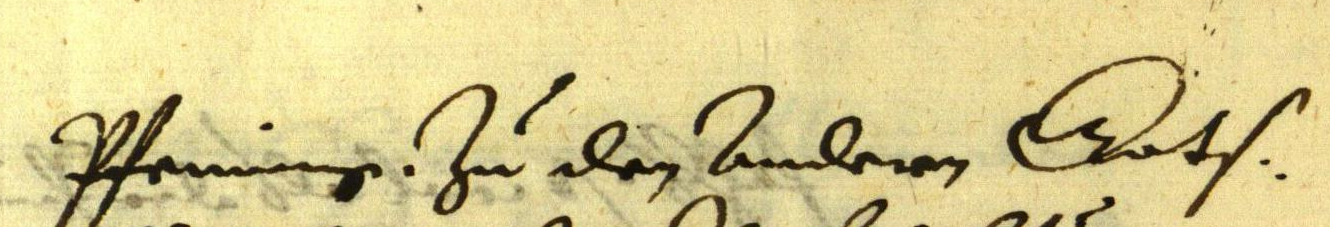Pfenning. Zū den Andern Gots¬
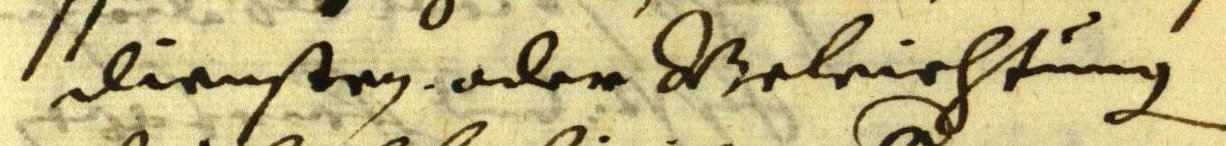diensten. oder Beleichtūng
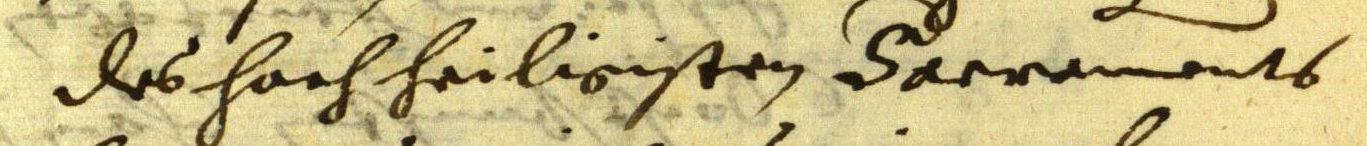des hoch heiligisten Sacraments
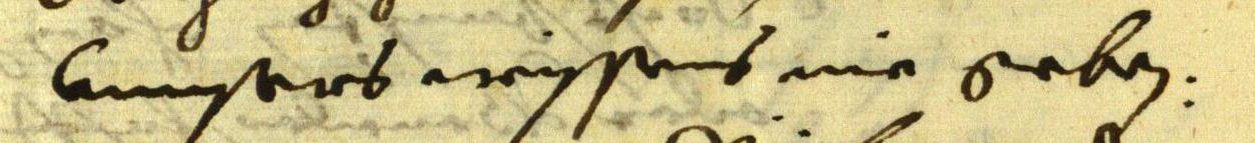unnsers wissens nie geben:
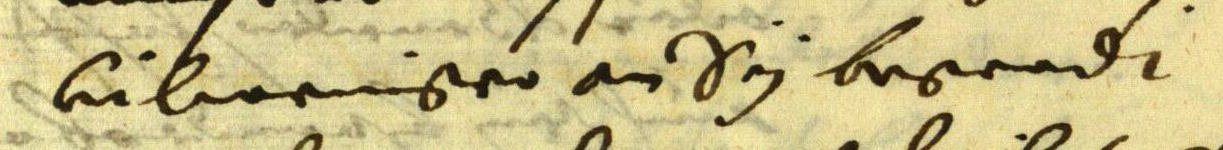vilweniger an Sÿ begerdt
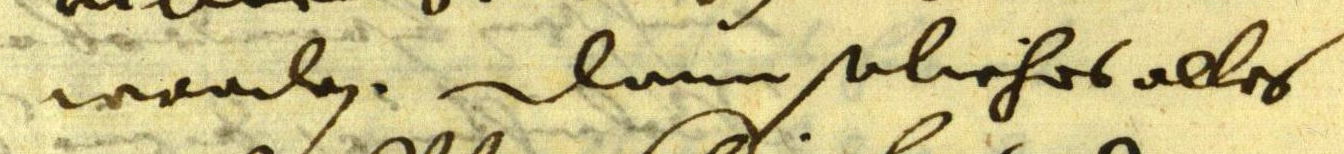worden. Dann soliches alles
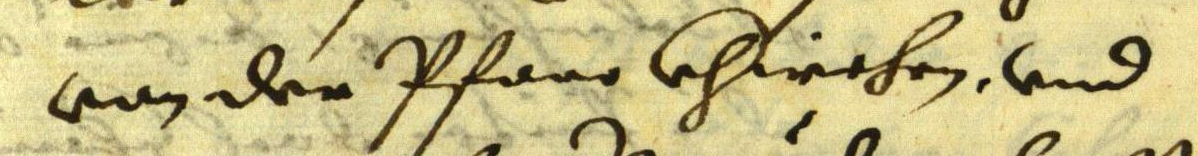von der Pfarr Khirchen. vnd
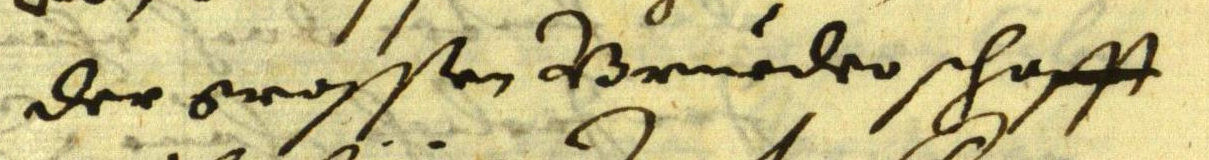der grossen Brūederschafft
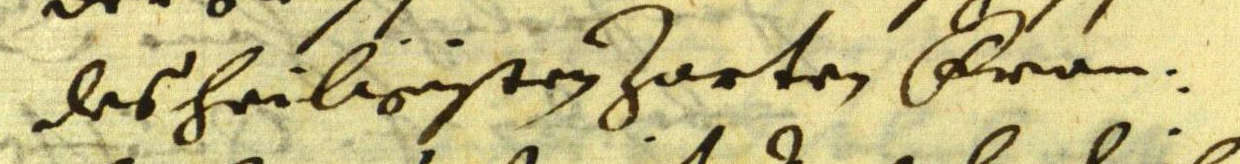des heiligisten Zarten Fron¬
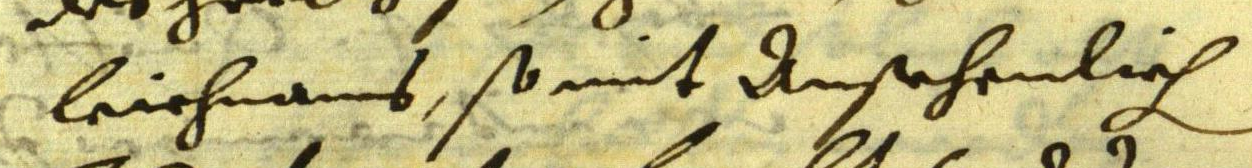leichnams, so mit Ansehenlich
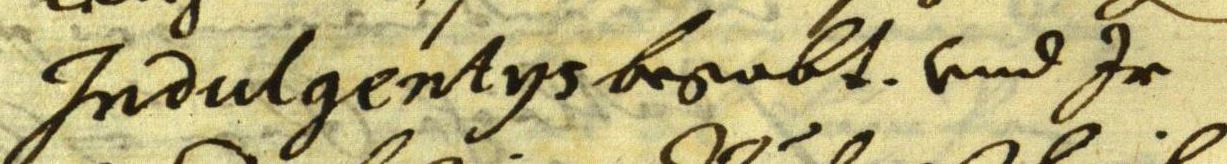Indulgentys begabt. vnd Ir
